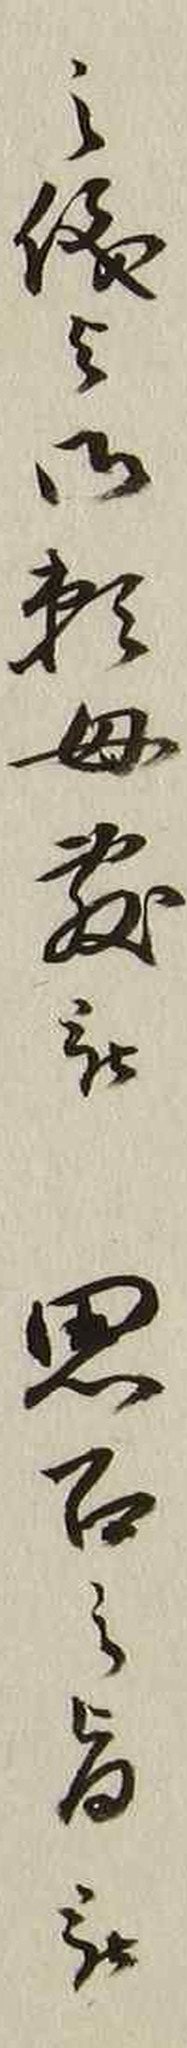之儀と御頼母敷被思召之旨被
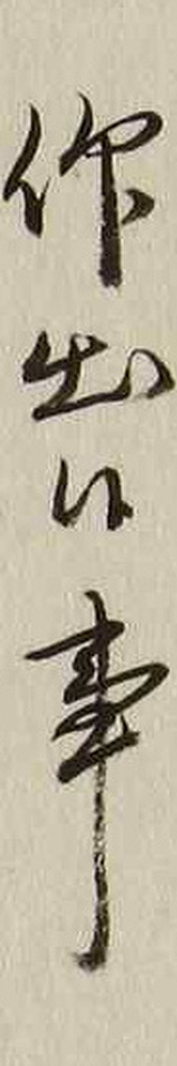仰出候事
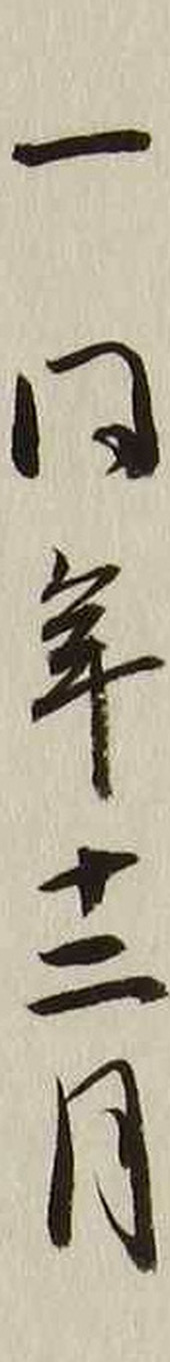一同年十二月
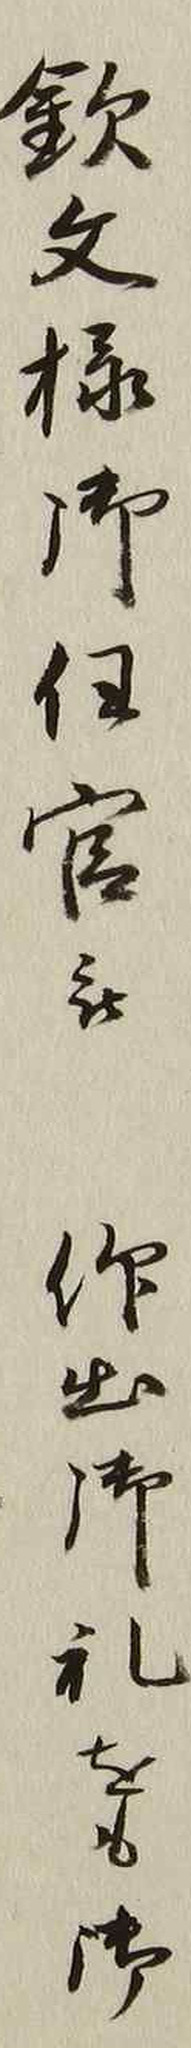欽文様御任官被仰出御礼をも御
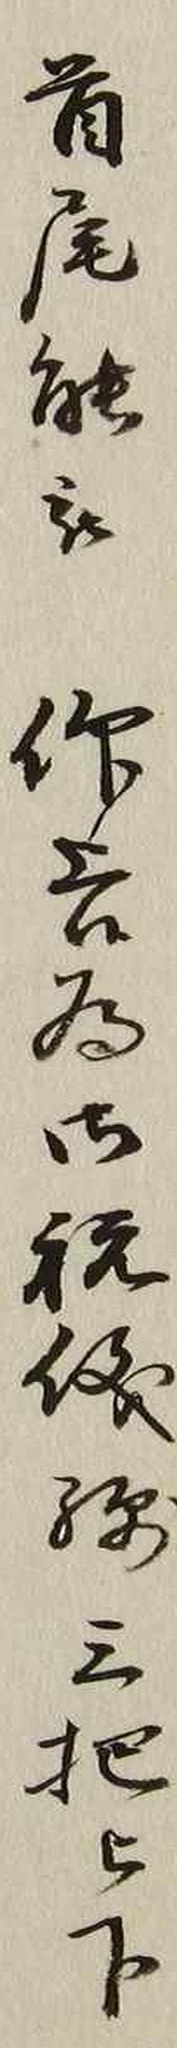首尾能被仰上候為御祝儀綿三把被下
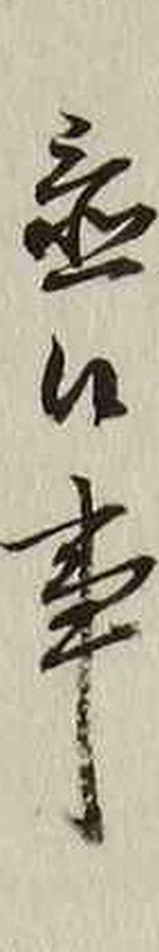置候事
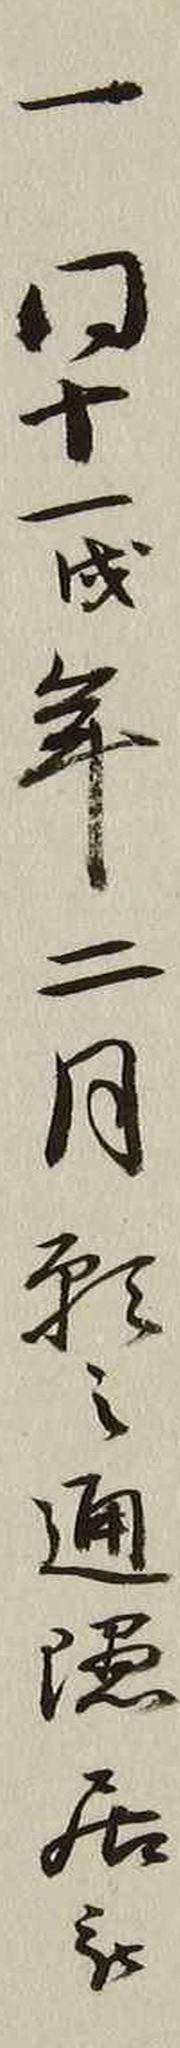一同十一戌年二月願之通隠居被
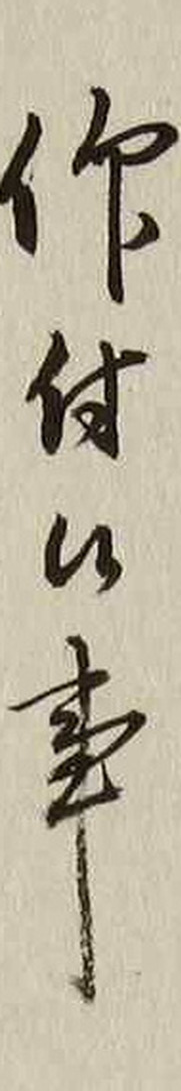仰付候事
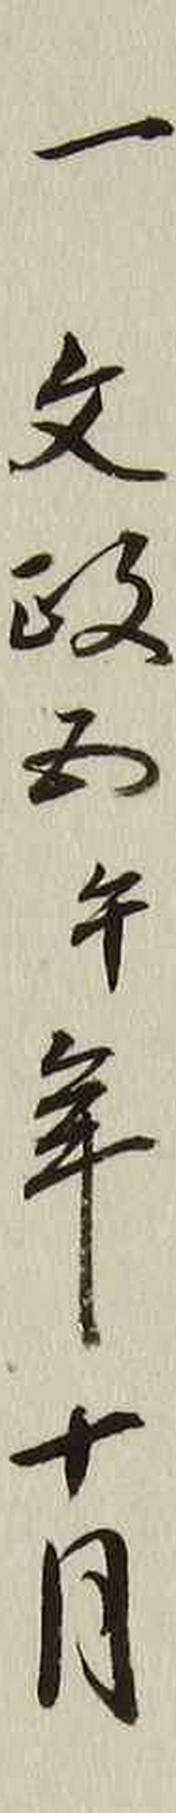一文政五午年十月
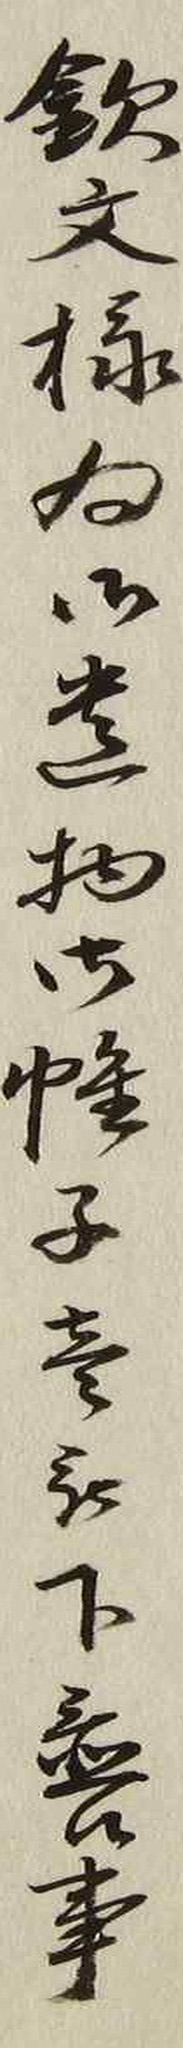欽文様為御遺物御帷子壱被下置候事
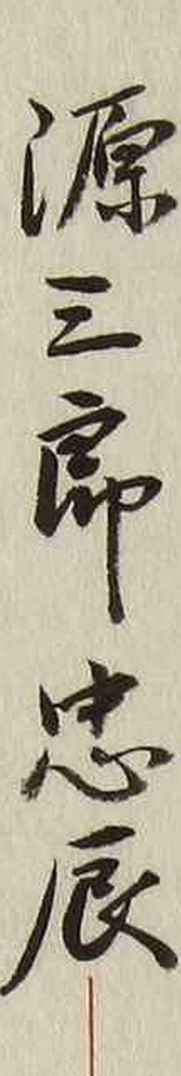源三郎忠辰
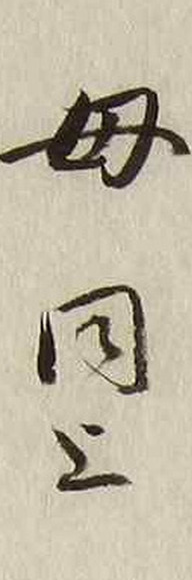母同上
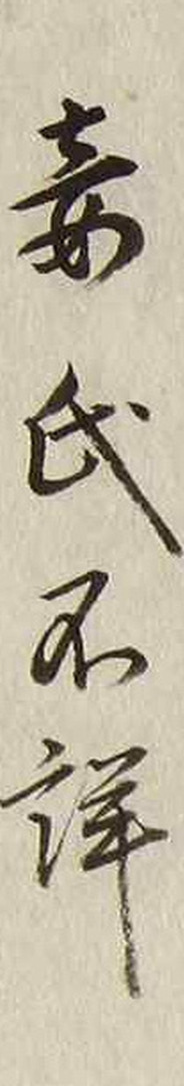妻氏不詳

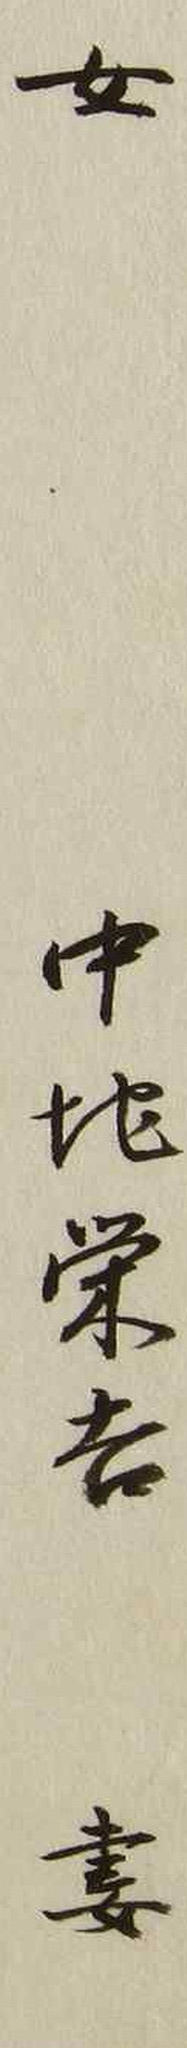女中地栄吉妻
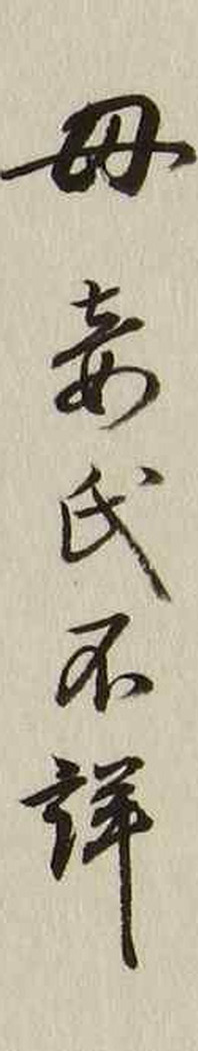母妄氏不詳
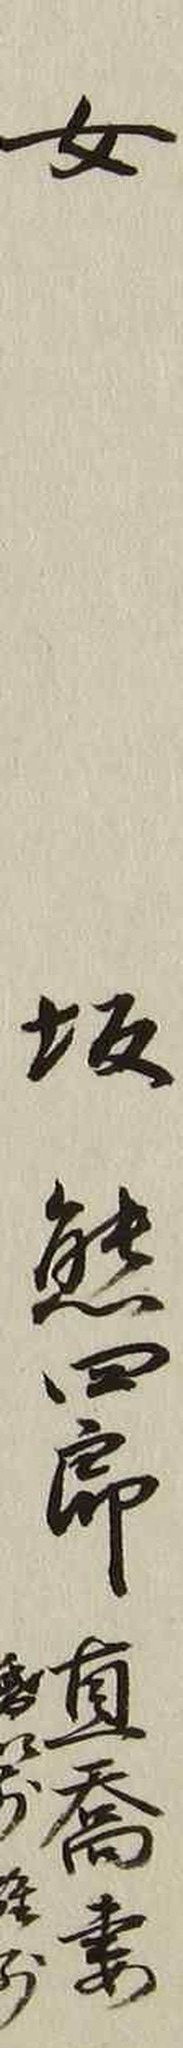女坂熊四郎直喬妻
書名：諸士系譜　巻之160　な之部2
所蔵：会津若松市立会津図書館
